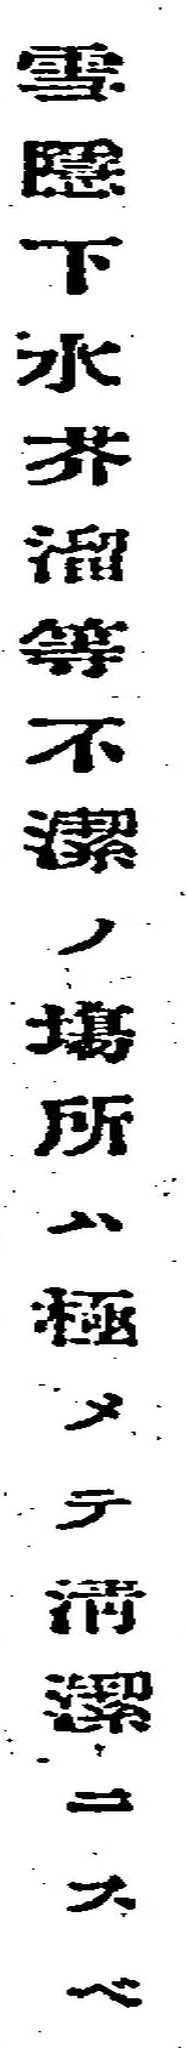雪隠下水芥溜等不潔ノ場所ハ極メテ清潔ニスベ
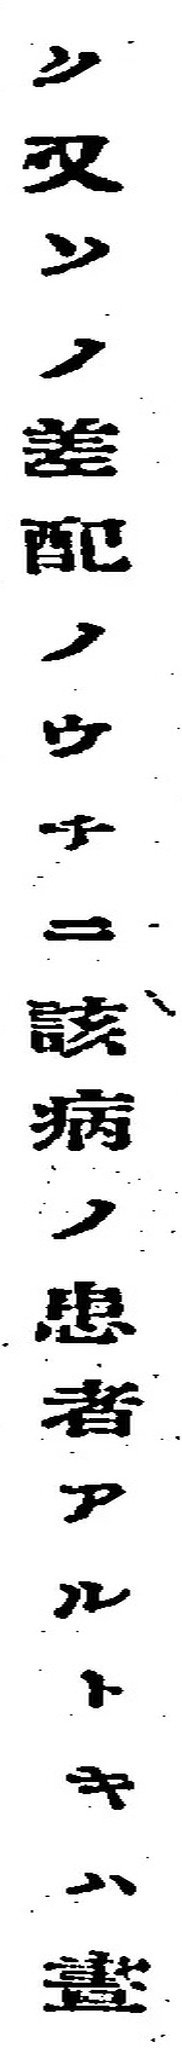ク又ソノ差配ノウチニ該病ノ患者アルトキハ昼
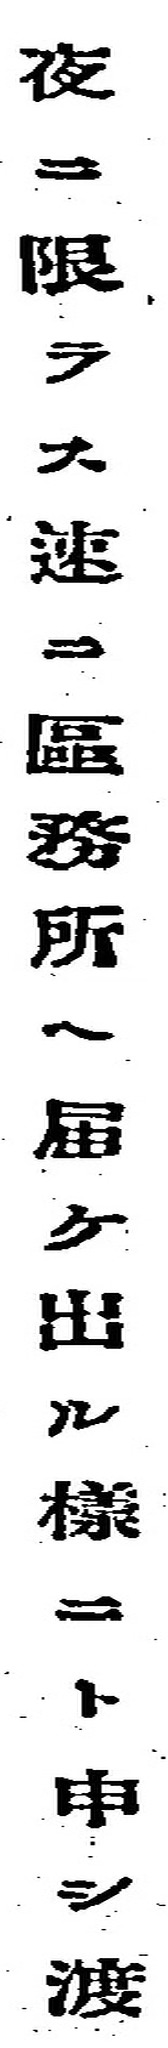夜ニ限ラス速ニ区務所ヘ届ケ出ル様ニト申シ渡

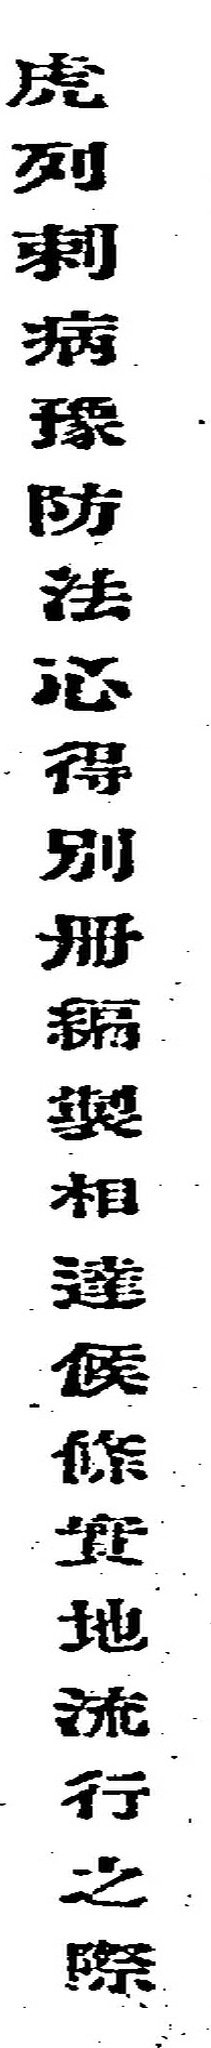虎列刺病予防法必得別冊編製相達候条実地流行之際
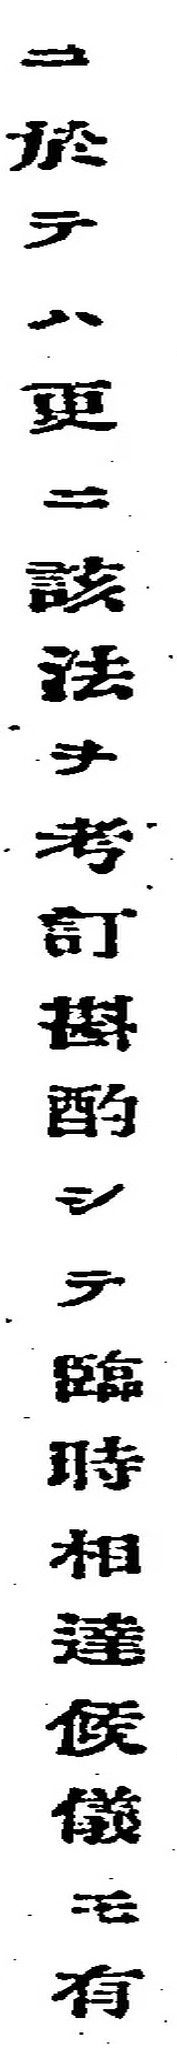ニ於テハ更ニ該法ヲ考訂斟酌シテ臨時相達候儀モ有
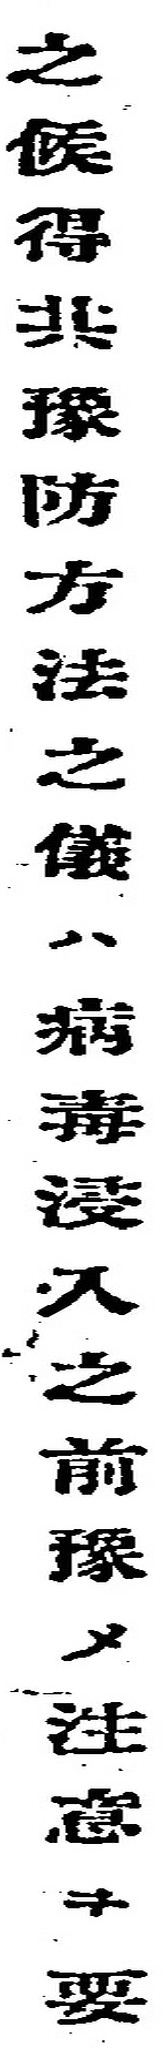之候得共予防方法之儀ハ病毒浸入之前予メ注意ヲ要
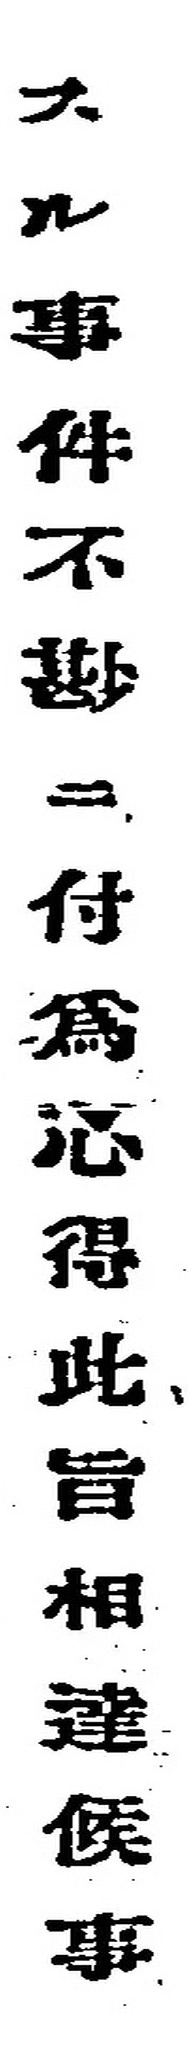スル事件不尠ニ付為心得此旨相達候事
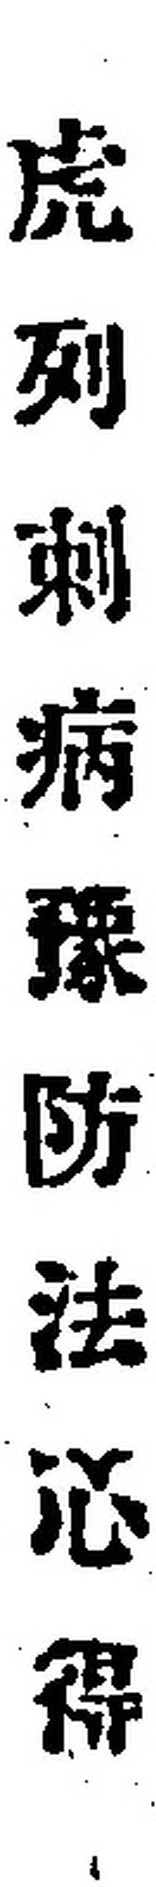虎列刺病予防法必得
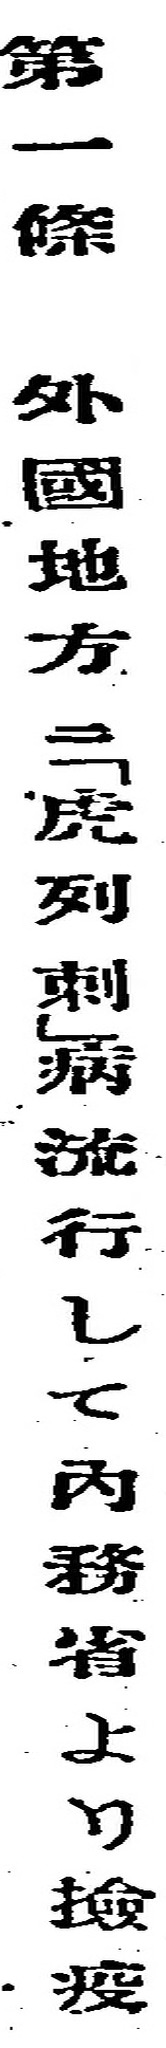第一条外国地方ニ「虎列刺」病流行して内務省より撿疫
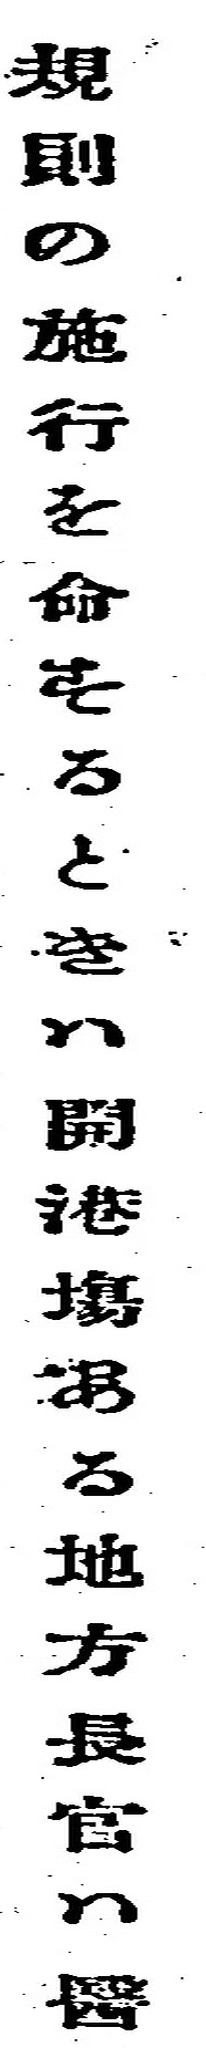規則の施行を命するときは開港場ある地方長官は医
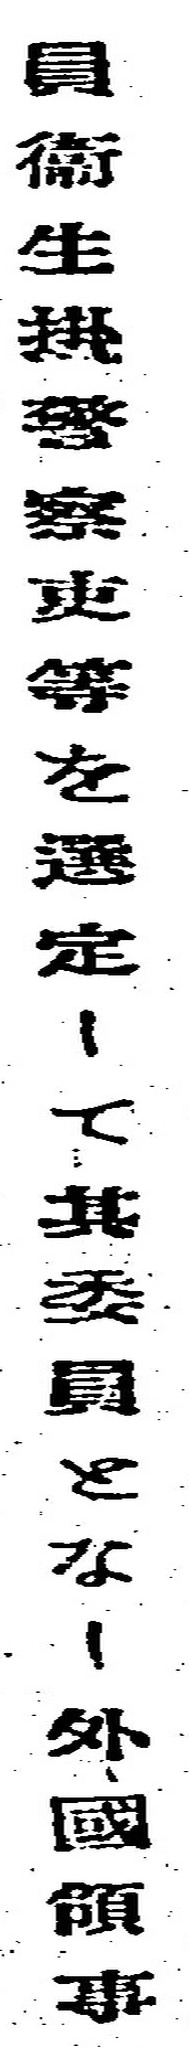員衛生掛警察吏等を選定して其委員となし外国領事
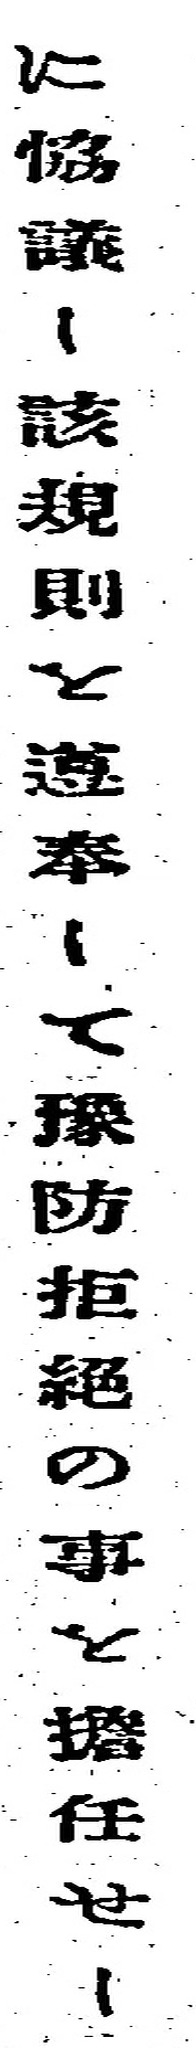に協議し該規則を遵奉して予防拒絶の事を担任せし
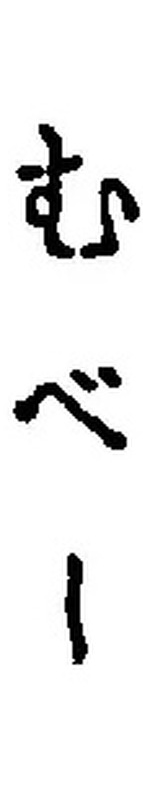むべし
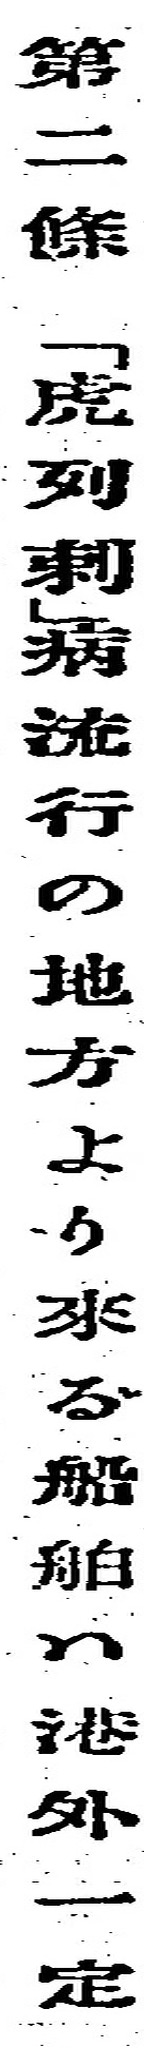第二条「虎列刺」病流行の地方より来る船舶は港外一定
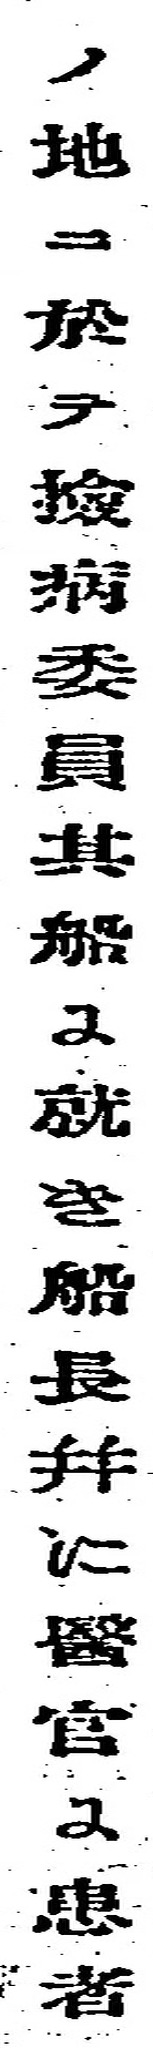ノ地ニ於テ撿病委員其船に就き船長并に医官に患者
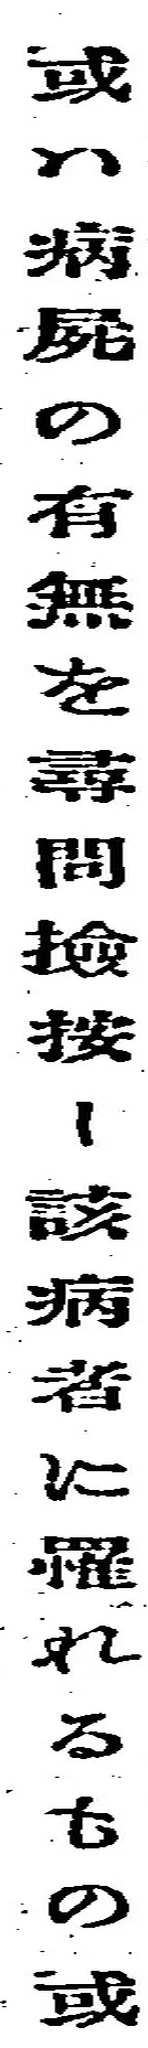或は病屍の有無を尋問撿按し該病者に罹れるもの或
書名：これら病予防心得
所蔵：国立国会図書館 National Diet Library, JAPAN
